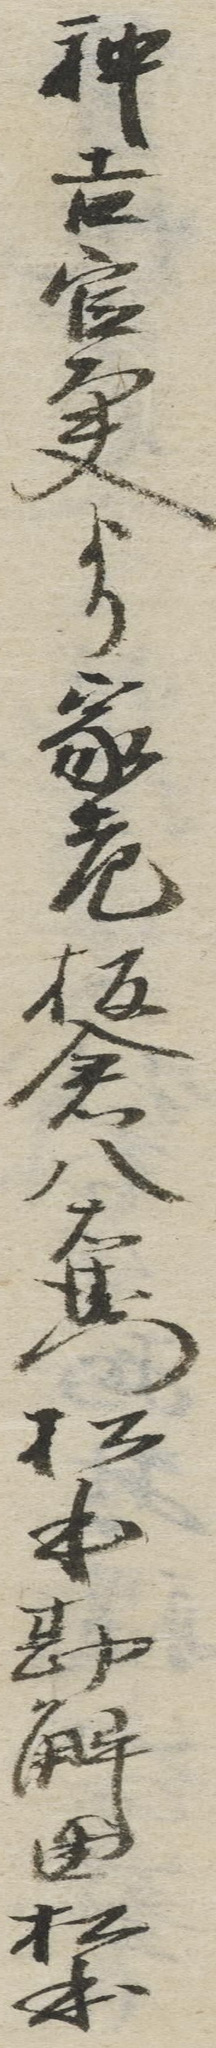神吉官大夫より家老板倉八右衛門松本勘解由松本
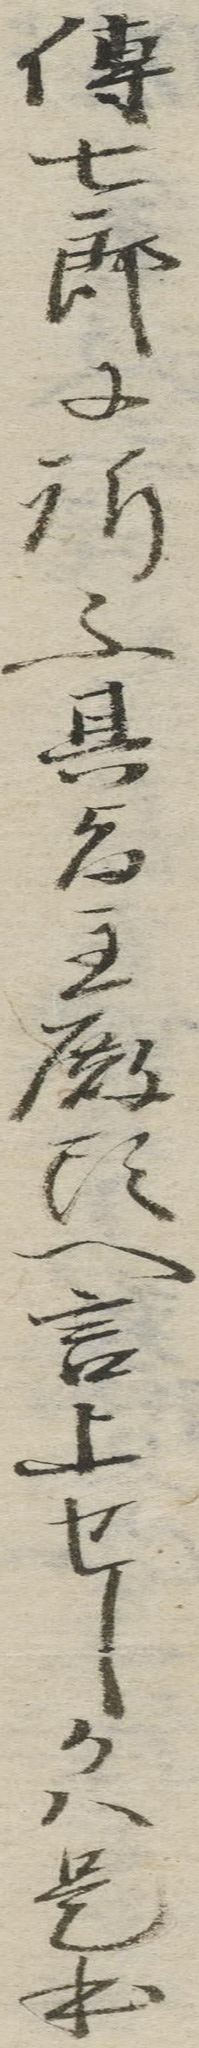傳七郎に訴ふ其旨主殿頭へ言上せしかハ是本
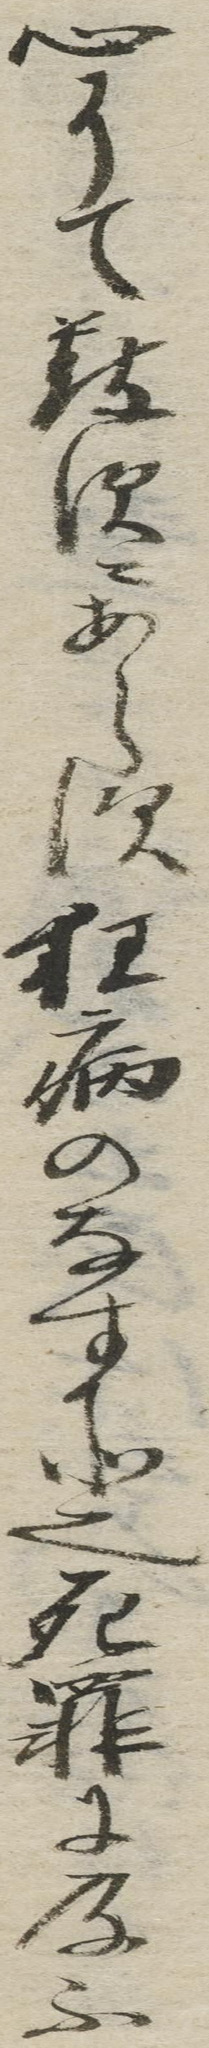心にて致すニあらす狂病のなす所也死罪に及ふ
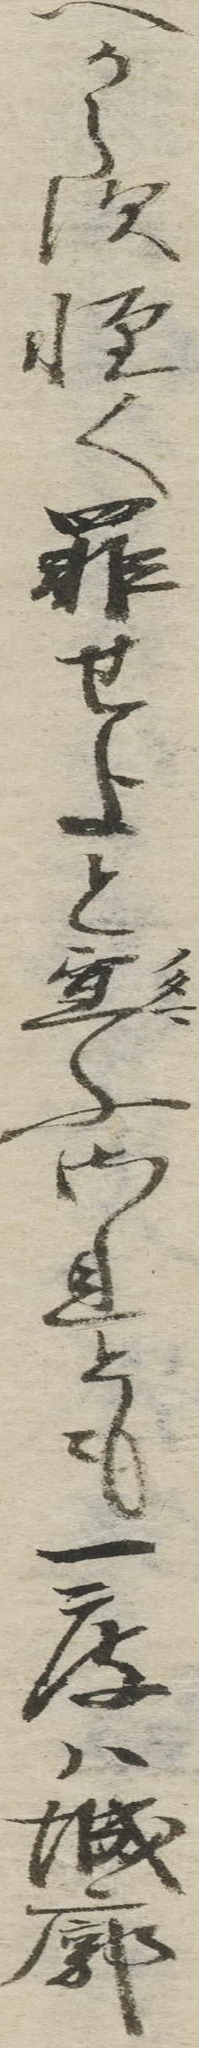へからす軽く罪せよと宣ふされとも一度ハ城郭
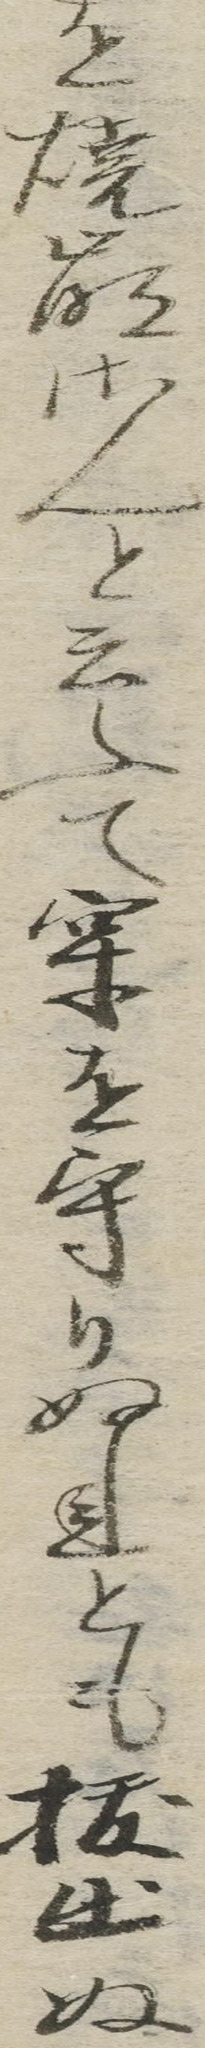を焼崩さんと云ふて牢を守りぬれとも抜出ぬ
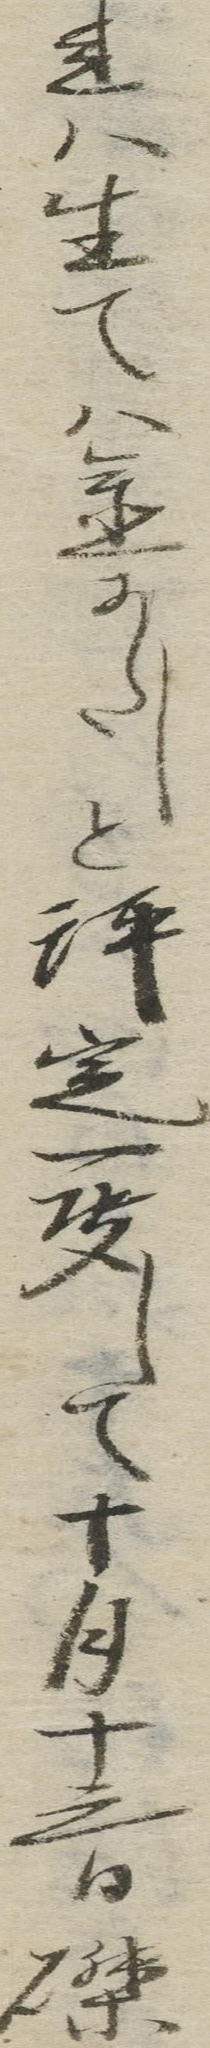れハ生てハ置かたしと評定一決して十月十三日磔
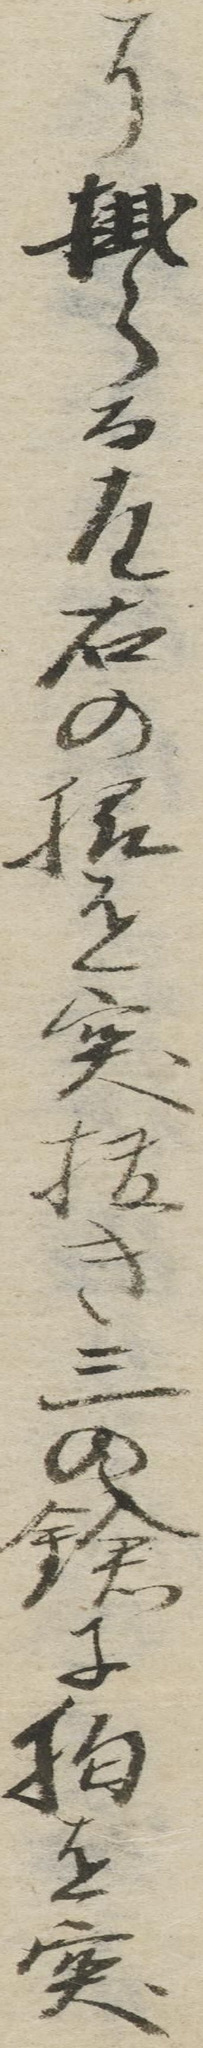に掛らる左右の脇を突抜き三の鎗に胸を突
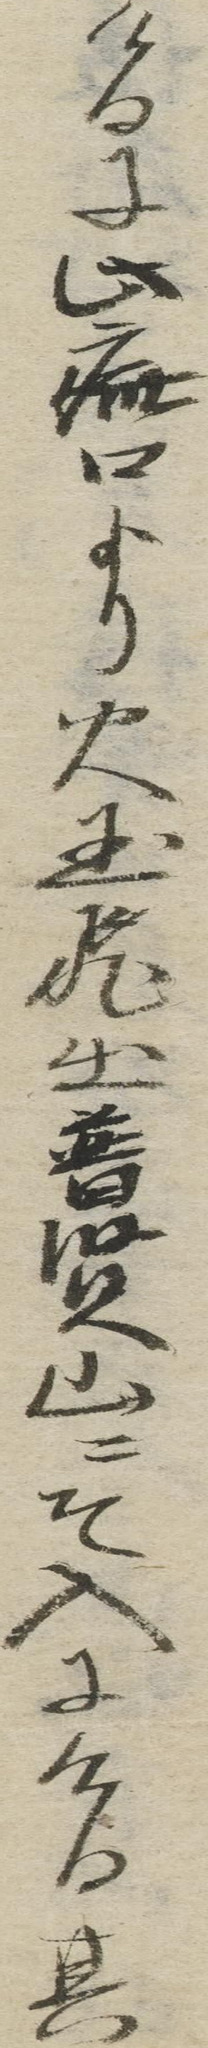けるに此疵口より火玉飛出普賢山にそ入にける其

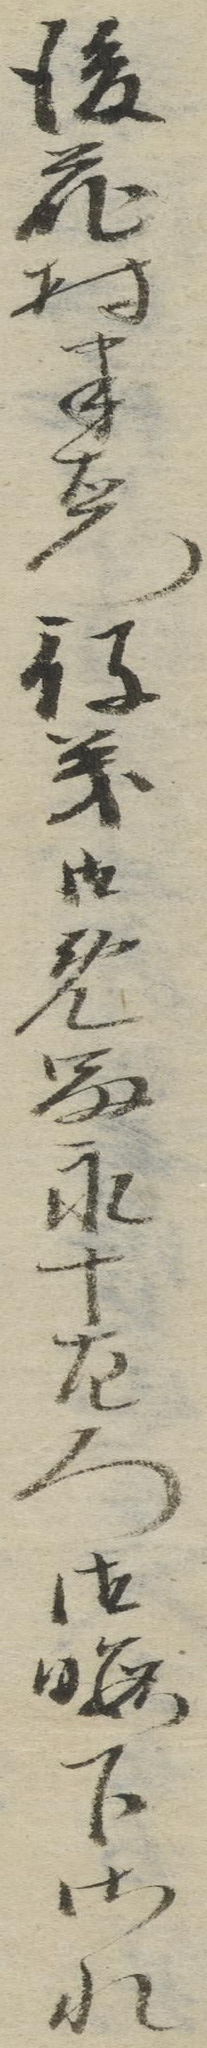後花村半右衛門役義御免富永十左衛門御暇下され
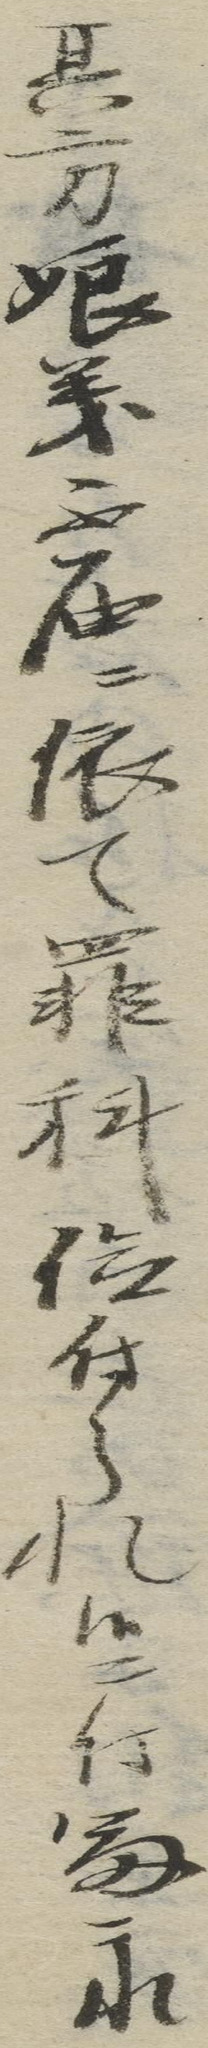其方娘義不届ニ依て罪科仰付られ候二付富永
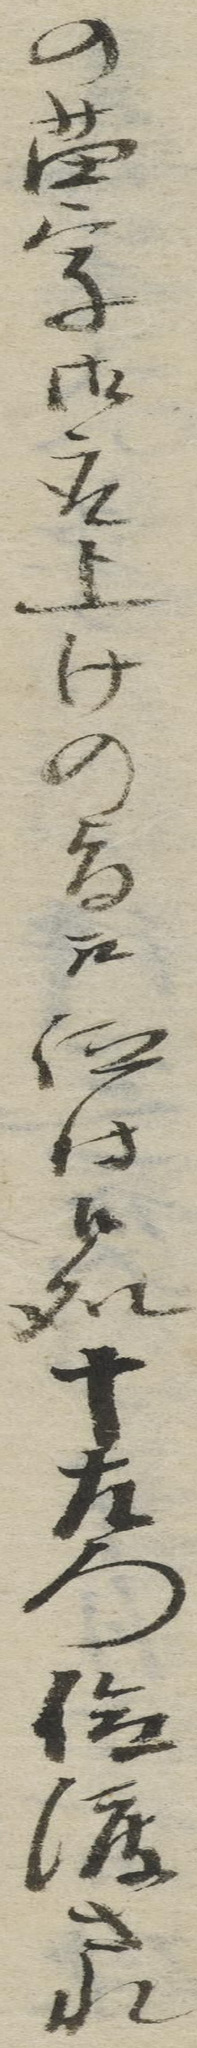の苗字御取上けの旨被仰付候処十左衛門仰渡され
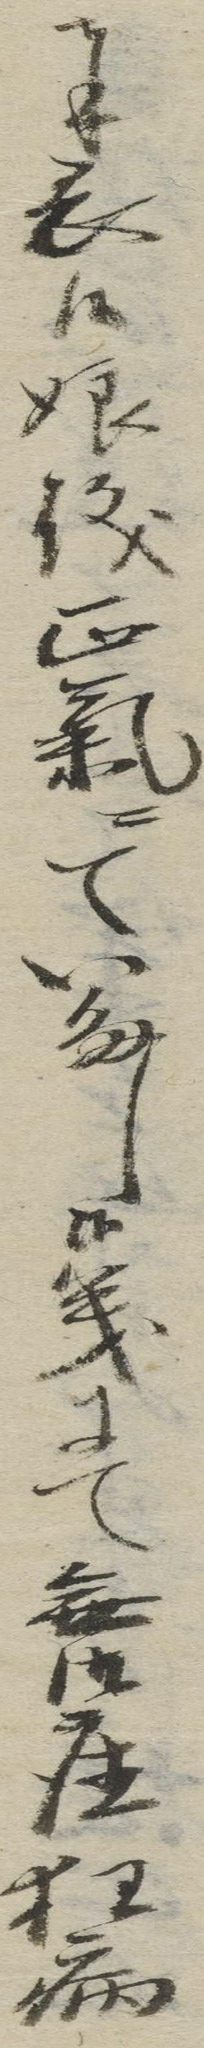奉畏候娘儀正気ニてハいたし候義にて無御坐狂病
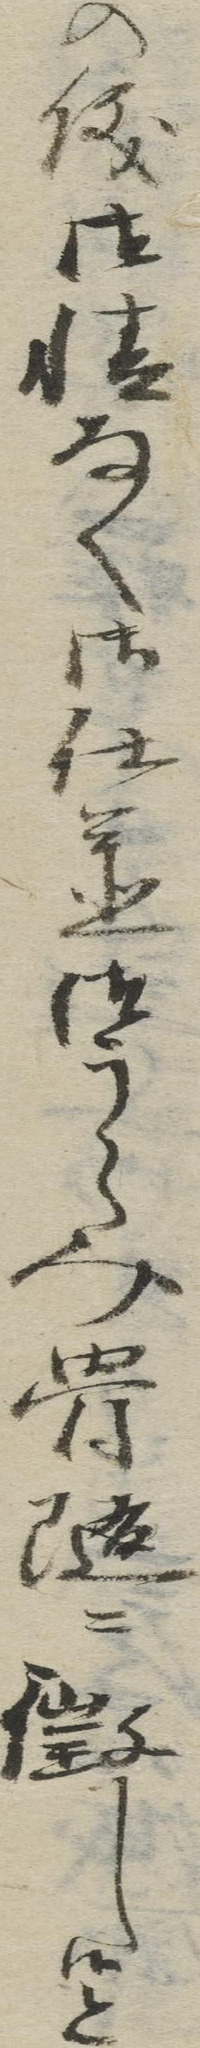の儀御情なく御仕置御うらみ骨髄ニ徴し候と
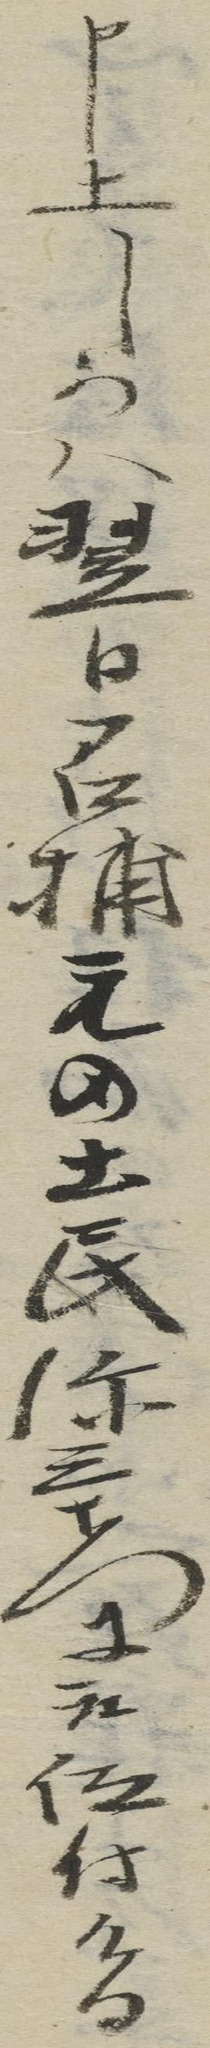申上しかハ翌日召捕元の土民弥三右衛門に被仰付ける
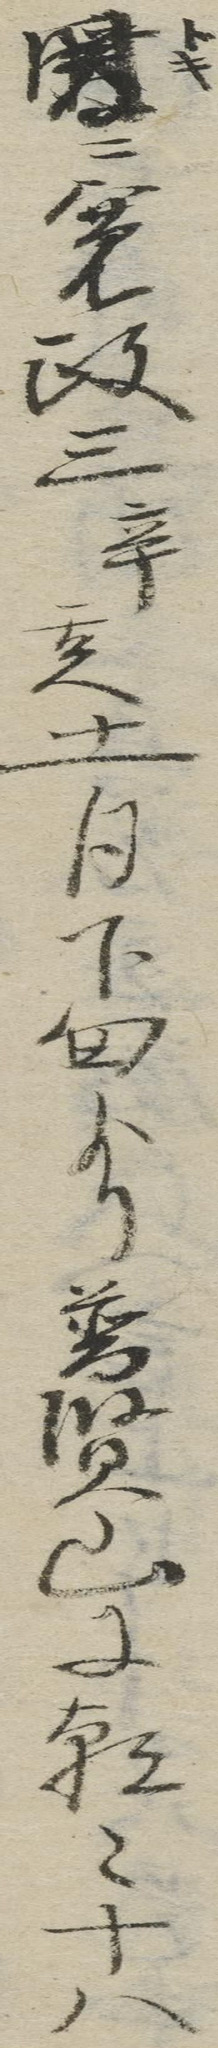鬨ニ寛政三辛亥十一月下旬より普賢山に乾〻十八
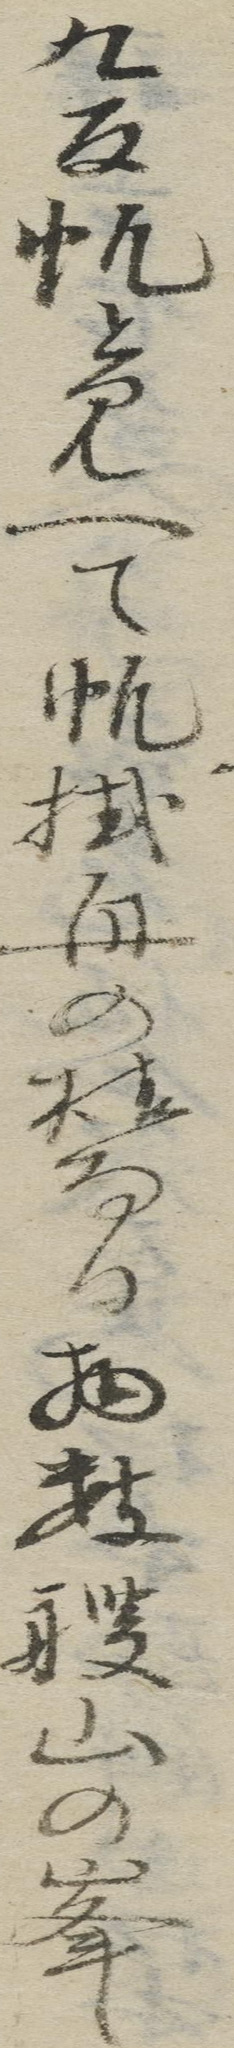九反帆と見へて帆掛舟の様なる物数艘山の峰
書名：肥前國島原領普賢山大変記　完
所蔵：東京大学地震研究所図書室 Earthquake Research Institute Library, The University of Tokyo, JAPAN
